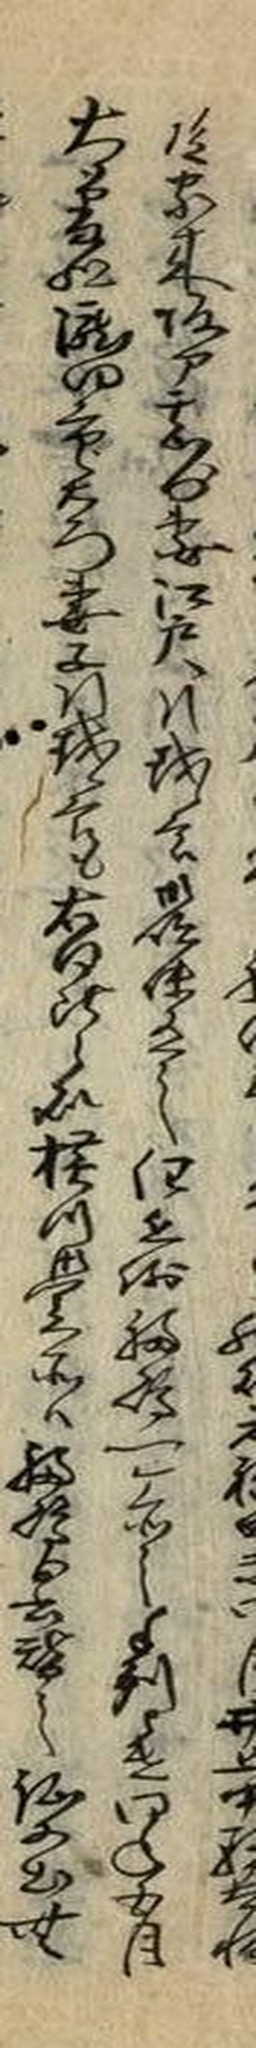大御番組瀧田市郎右衛門妻子引越候節も右同断之処横川御関所ハ福嶋ゟ書替之証文出無
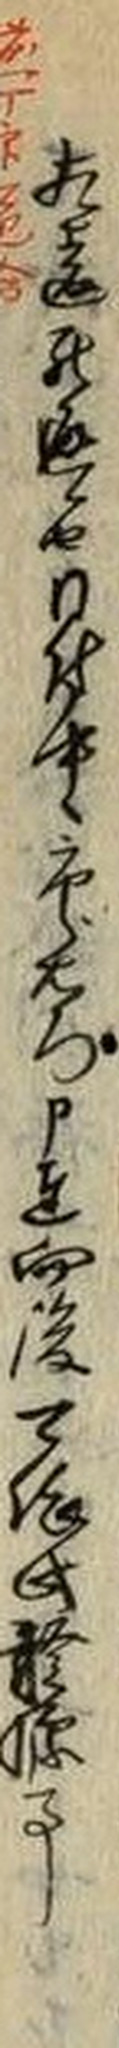相違罷通候由目付中へ市郎右衛門申達向後可依此証拠事
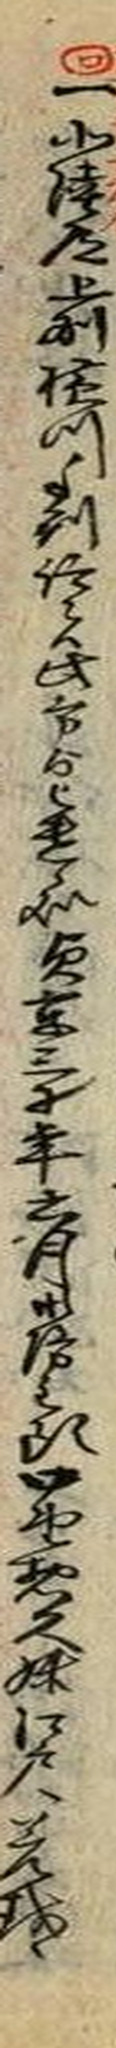一北陸道上州横川手判跡ニハ此方ゟ被遣候処貞享三寅年六月御坊主頭中野惣久妹江戸へ差越候
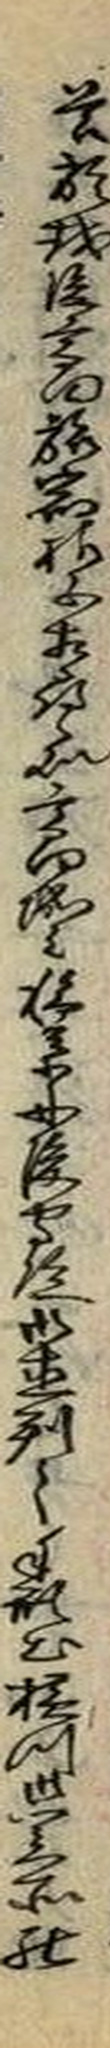節於越後高田旅宿様子相尋候処高田城主稲葉丹後守殿御直判之手形出横川御関所罷
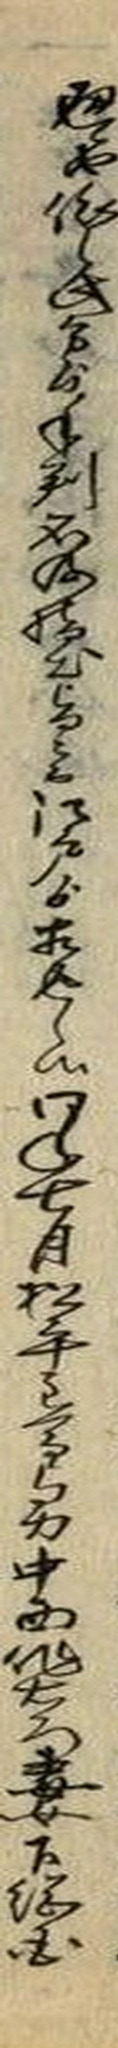通候由依之此方ゟ手判不及指出旨ニ而江戸ゟ相返之候同年七月松平主馬与力中西作右衛門妻女下総国
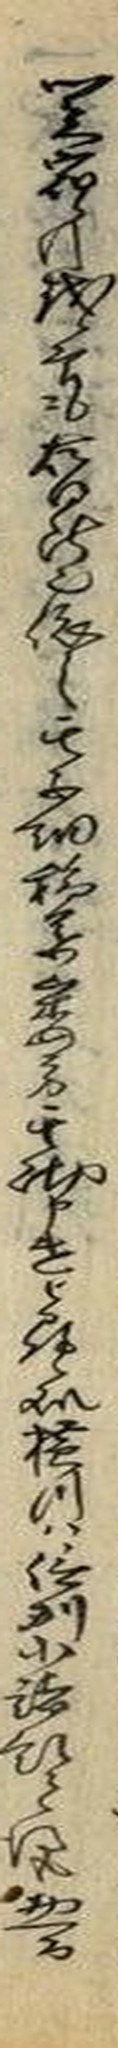関宿へ引越候節も右同断也依之其子細稲葉采女方其砌申遣被尋候処横川ハ信州小諸領ニ候得共惣而
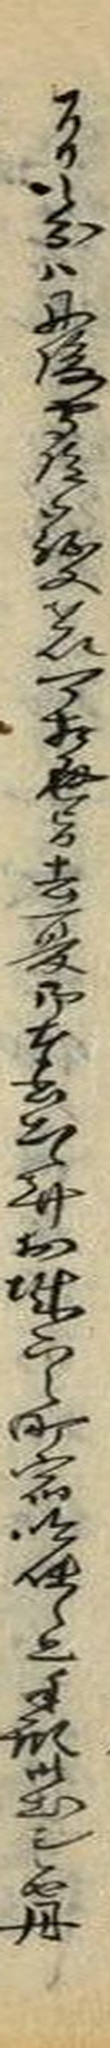下り候分ハ丹後守殿御証文を以可相通旨去夏御奉書出候刻於城下之町宿吟味之上手形御出シ候由丹
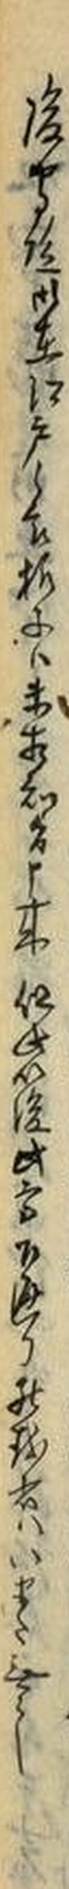後守殿御在江戸之節様子ハ未相知旨申来但此以後此方下通り罷越者ハいまた無之
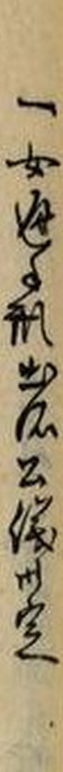一女通手形出所公儀御定
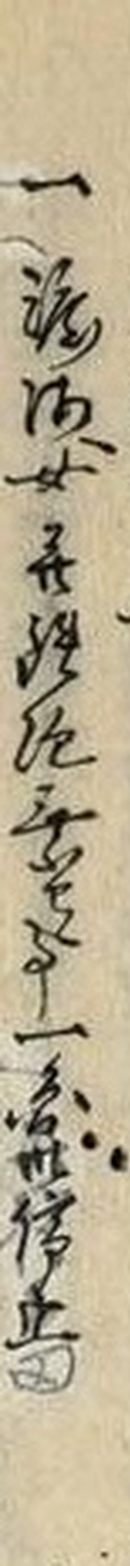一渡海へ女幷鉄炮乗セ候事一円御停止
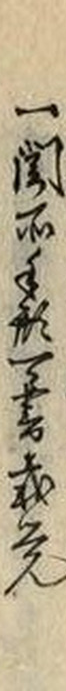一関所手形可書載覚
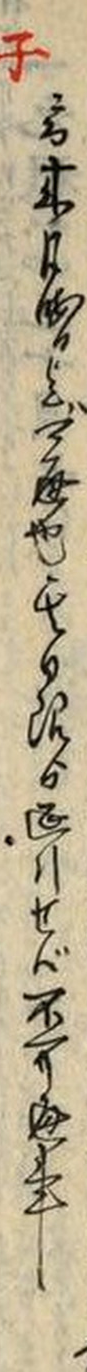ニ而来月晦日迄ハ可通也其日限ゟ延引せバ不可通事

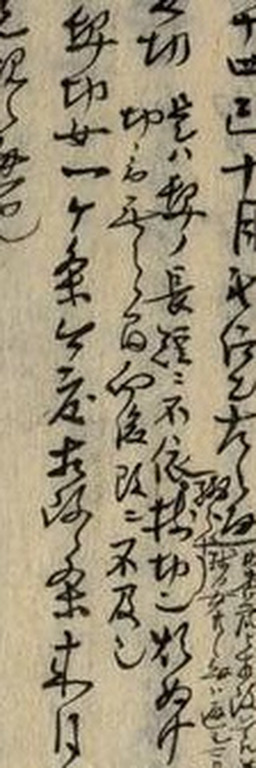切ニ而無之候間向後改ニ不及也
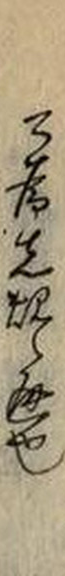可為先規之通也
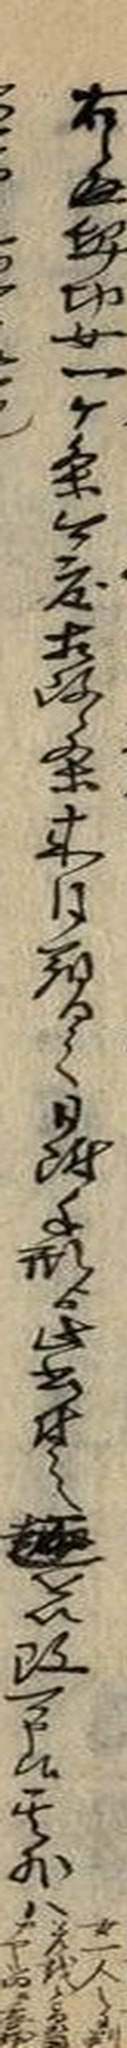右之通髪切女一ケ条今度相改候条来月朔日之日附手形ゟ此書付之趣を以改可申候其外ハ
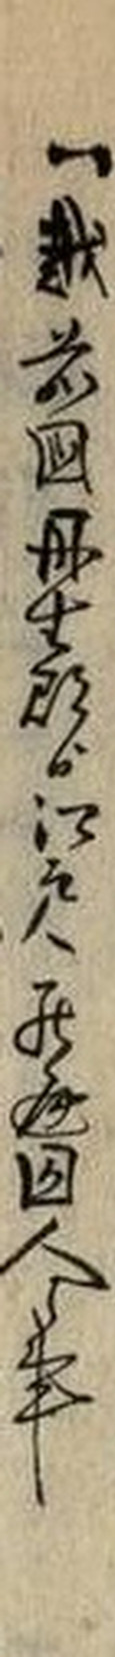一越前国丹生郡ゟ江戸へ罷通囚人之事
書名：御国他国諸事之部
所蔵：福井県文書館 Fukui Prefectural Archives
